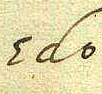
E do
